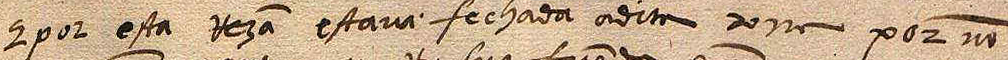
E por esta Rezā estaua fechada a dita torre por n̄o
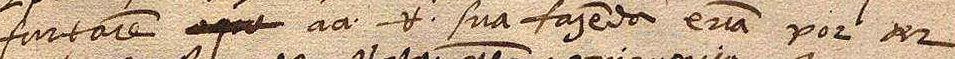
furtar̄e o que aa R. sua fazēda e n̄a por ter
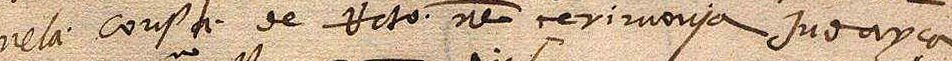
nela cousa de Rito n̄e cerimonja Judayca
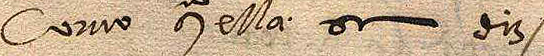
Como ꝯ̄ ella se diz/
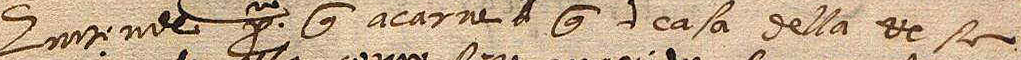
Emtende ꝓ̄. q̄ a carne ē q̄ ē casa della Re se
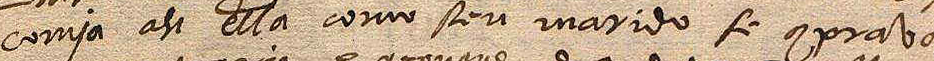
comja asi ella como seu marido se ꝯprava
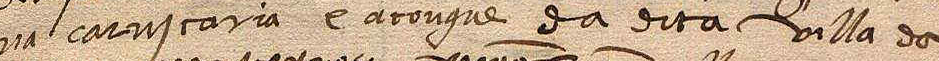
na carnjçaria e açougue da dita villa da
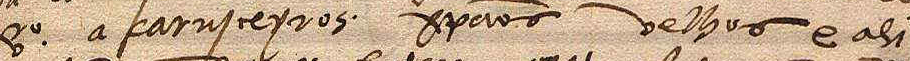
vro. a carnjceyros. xpãos velhos e asi
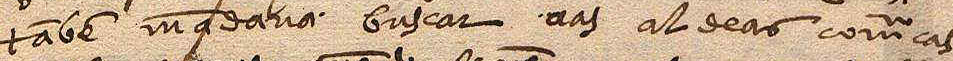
tābē m̄adaua buscar aas aldeas com̄cas
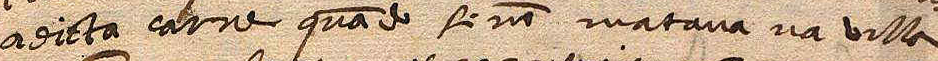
a dicta carne qūado se n̄o mataua na villa
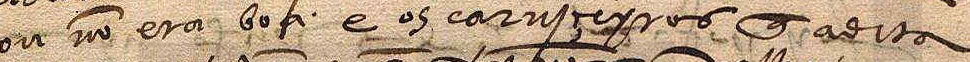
ou n̄o era boa e os carnjceyros q̄ a dita
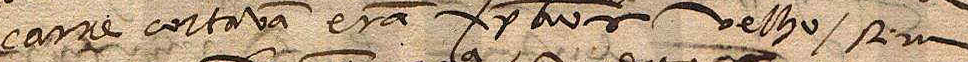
carne cortavā erā Xpãos velho / sem
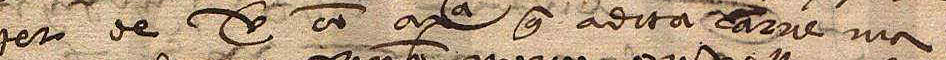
ter de ꝟ c̄o a pa q̄ a dita carne ma
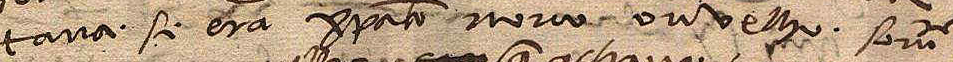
taua se era xpão nouo ou velho . somte
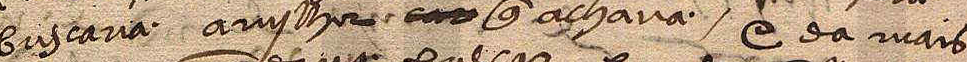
buscaua a mjlhor car q̄ achaua / e da mais
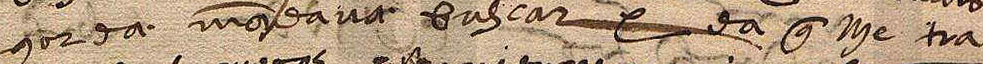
gorda mādaua buscar e da q̄ lhe tra
